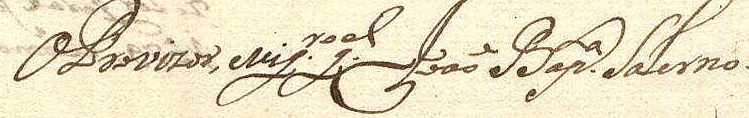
O Provizor, e vig.ro g.al Joaõ Bap.ta Salerno
